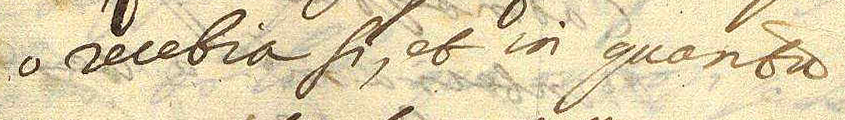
o recebia si, et in quanto
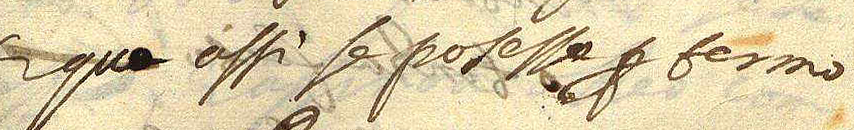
E que assi se posesse ꝑ termo
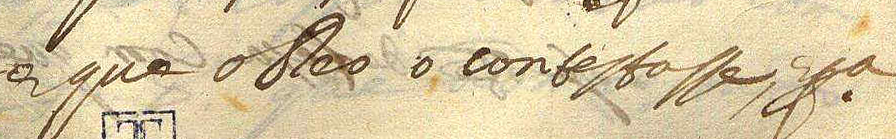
E que o Reo o contestasse, E ꝑ.a
